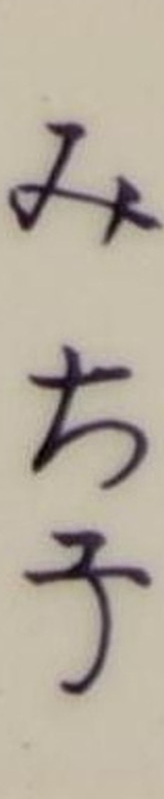みち子
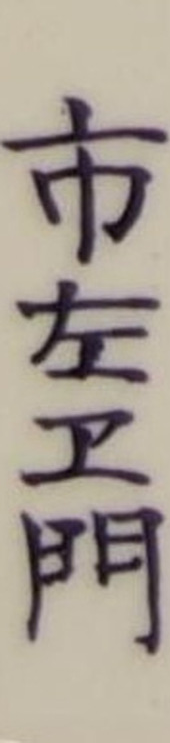市左ヱ門

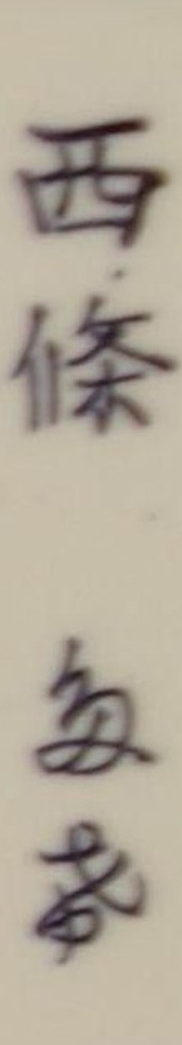西條たけ
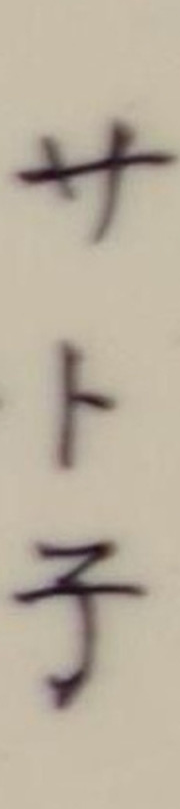サト子
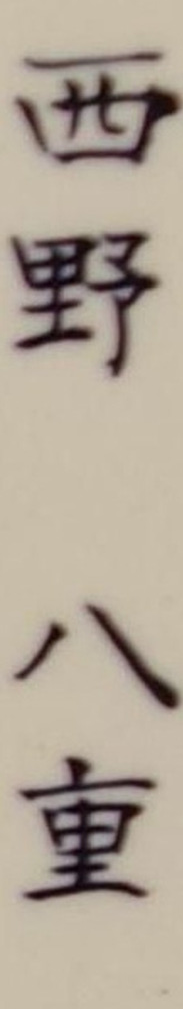西野八重
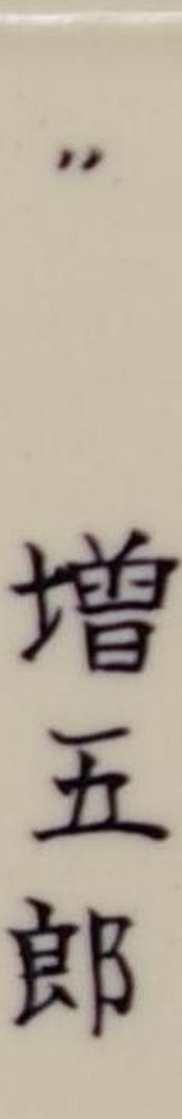増五郎
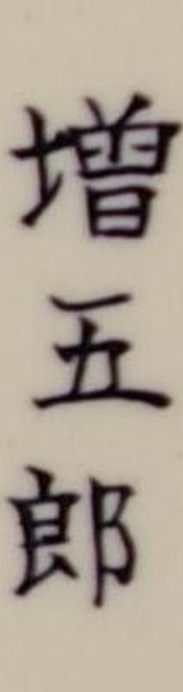増五郎
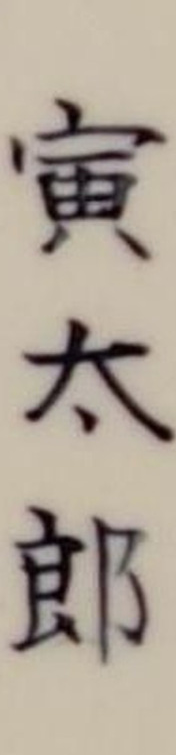寅太郎
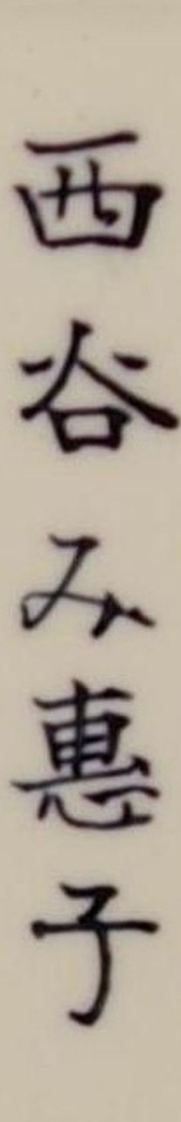西谷みえ子
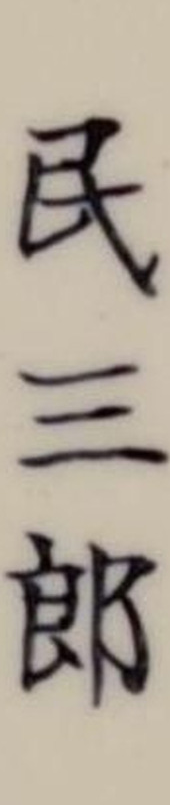民三郎
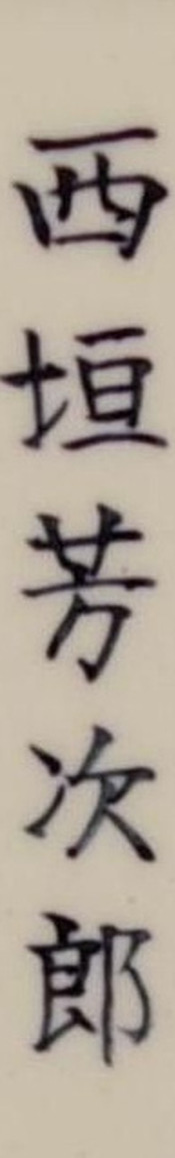西垣芳次郎
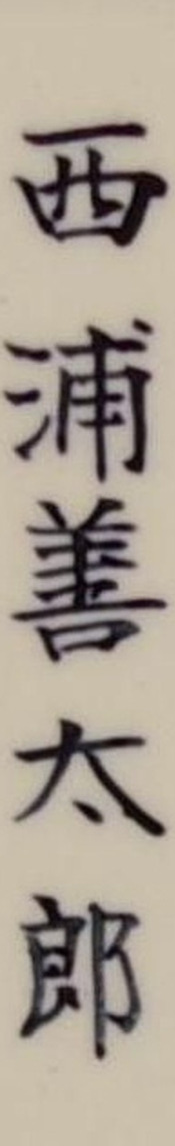西浦善太郎
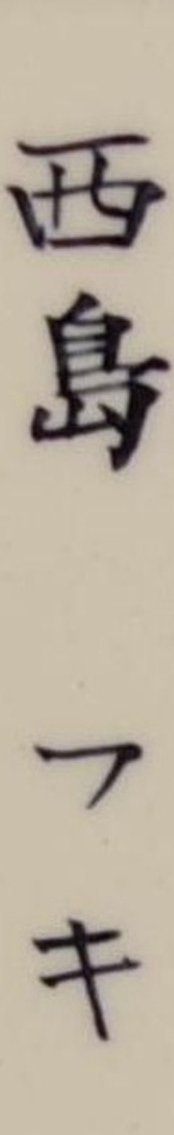西島フキ
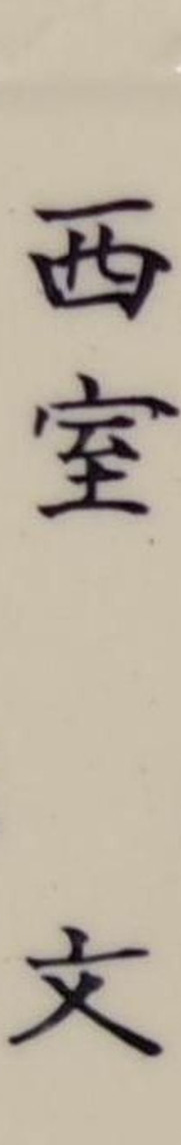西室文

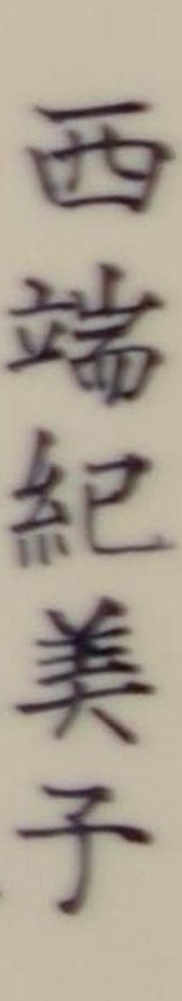西端紀美子
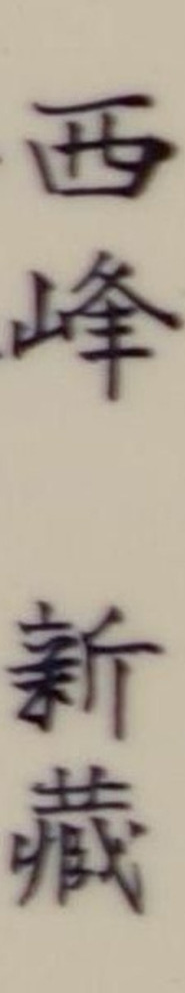西峰新蔵
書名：M~S
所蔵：高野山金剛峯寺
